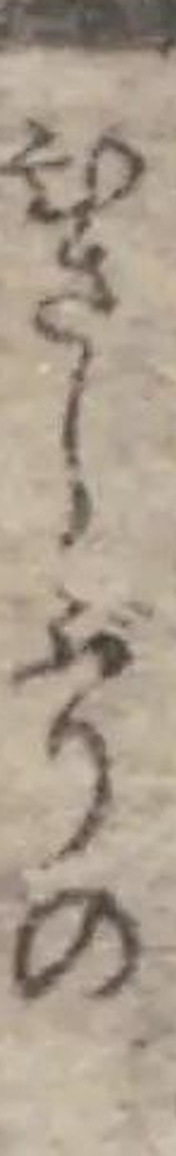ひさしぶりの
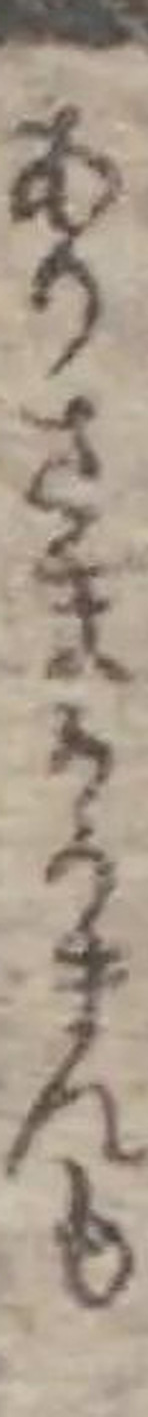ありさまかうまんも
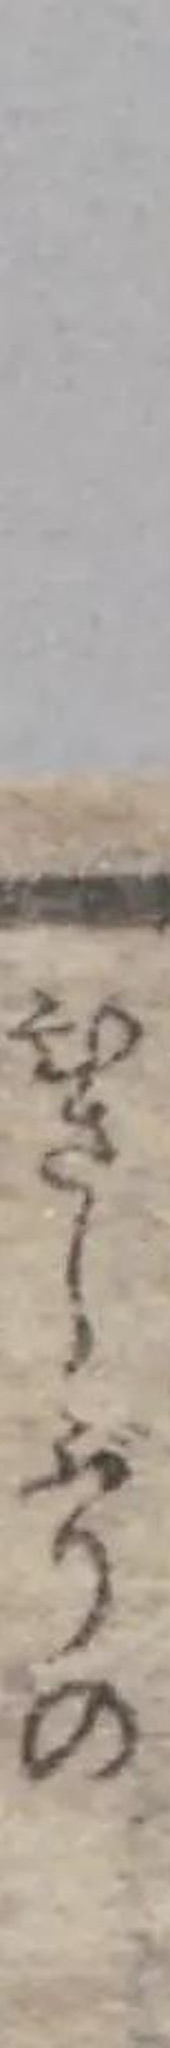ひさしぶりの
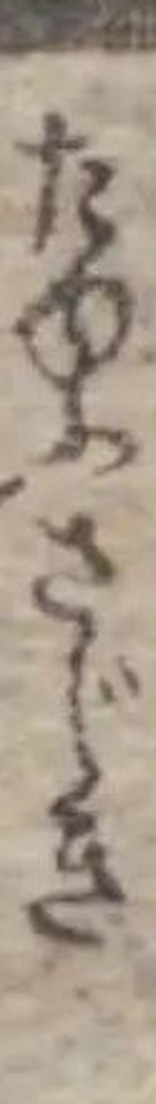たゆうさじき
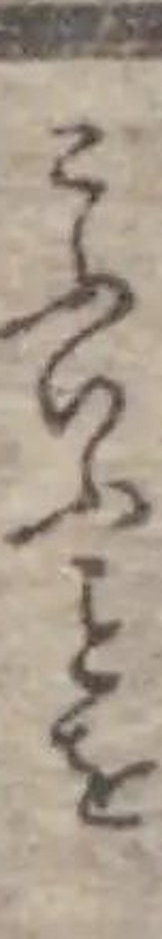こふいふことを
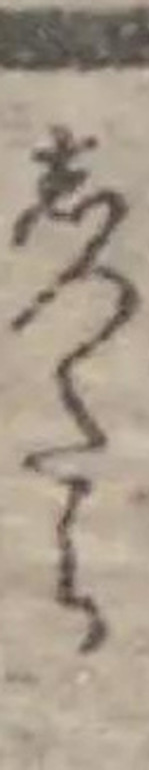しつたら
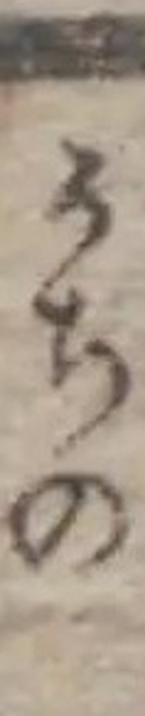うちの
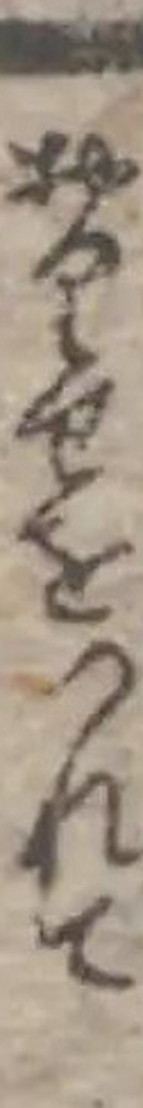おりせをつれて
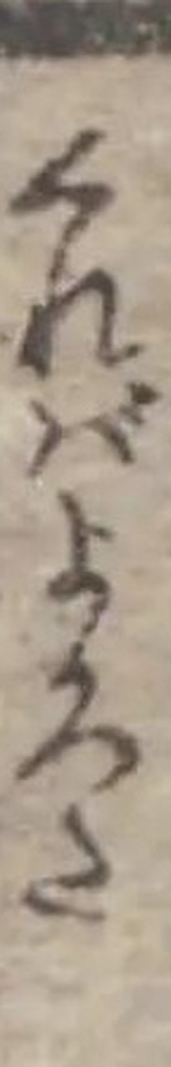くればよかつた
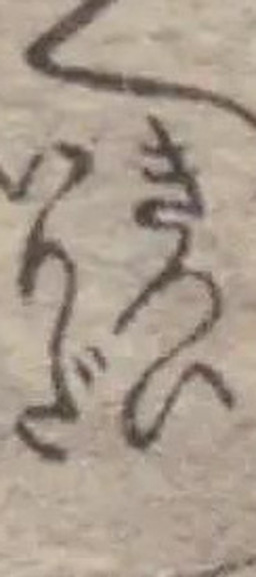いりだ
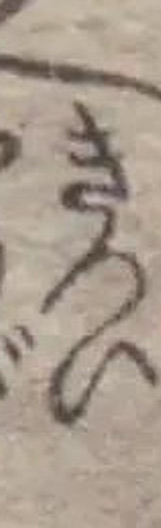きつい
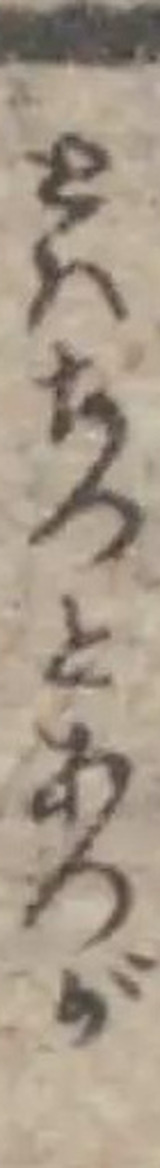とはちつとあつが
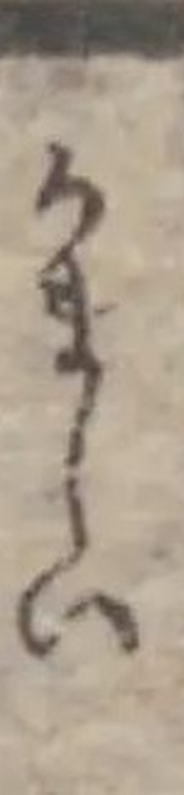かましい
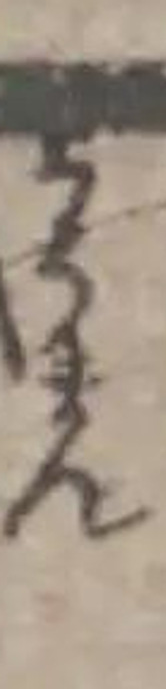かうまん
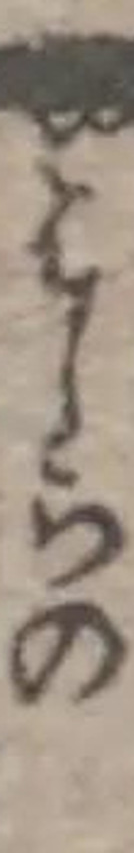〽はしらの
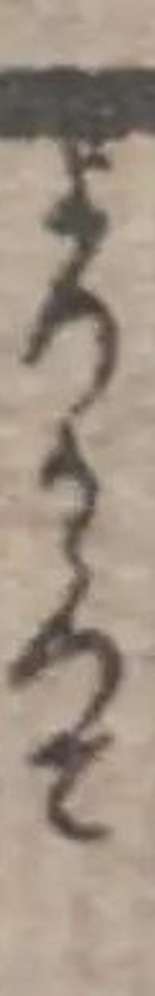よりかゝつて
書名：富多高慢噺 3巻
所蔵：国立国会図書館 National Diet Library, JAPAN
